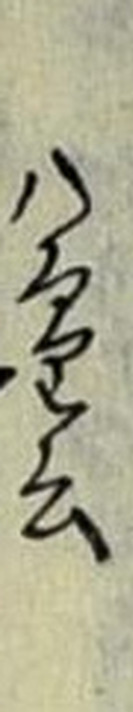八百里云
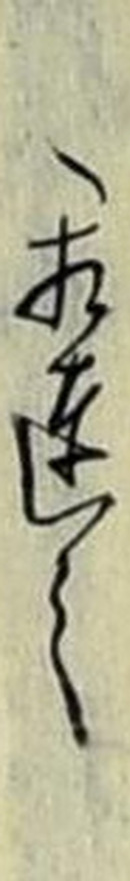へ相達之
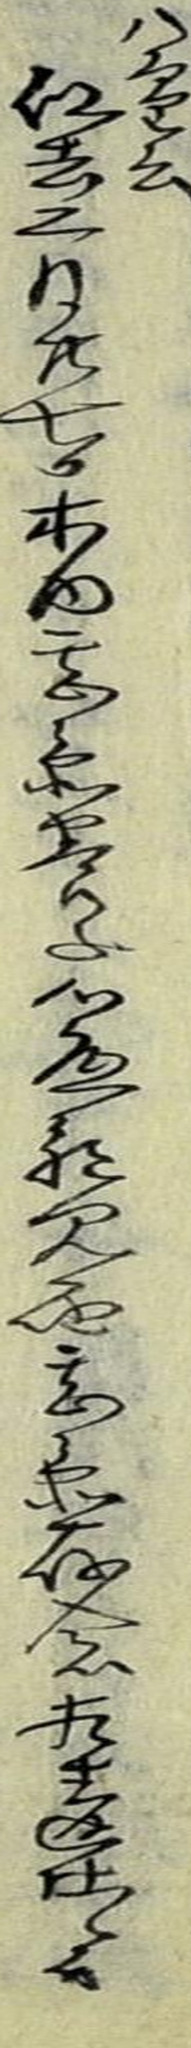但去二月廿七日木内甚兵衛養子心底難見届甚兵衛存念相違仕候ニ付
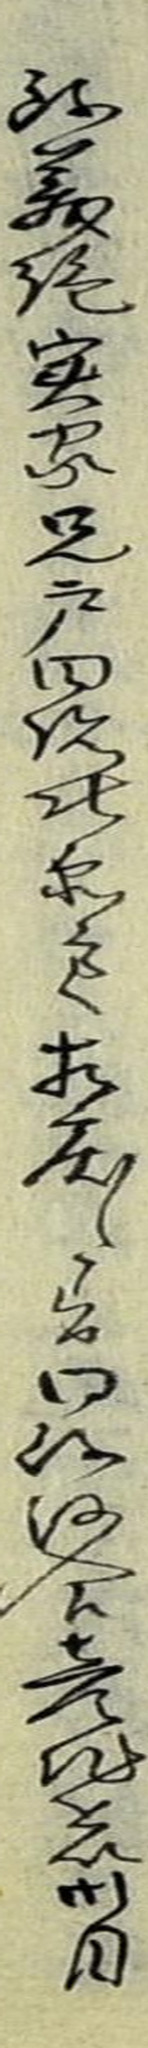致義絶実家兄戸田弥次兵衛方へ相戻し候旨同役河合彦作を以御目
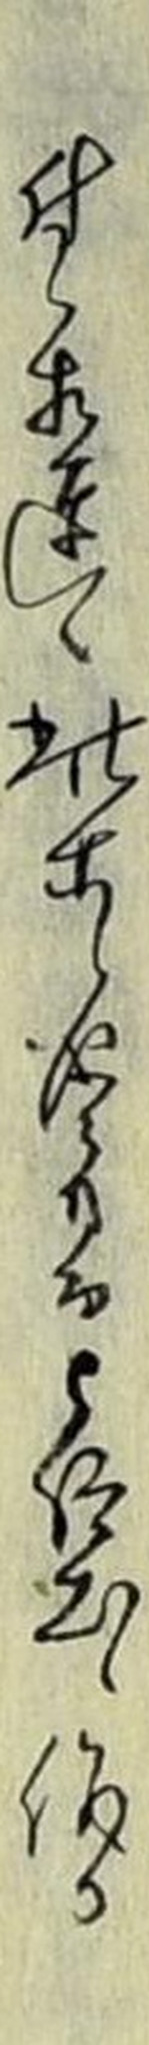付へ相達候此等之儀ニ付而被仰出候儀か
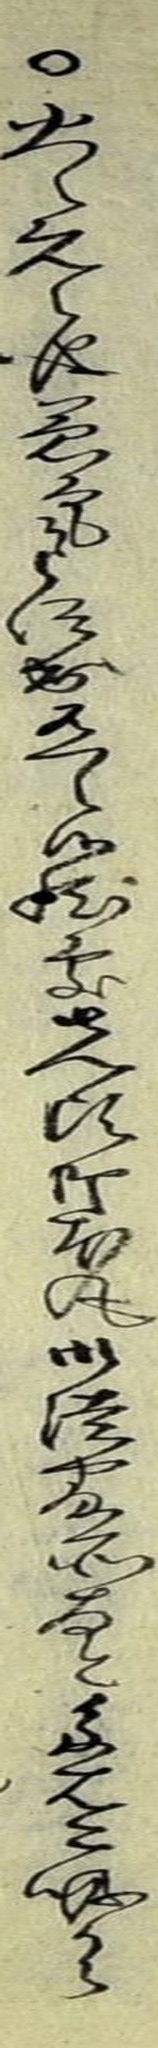〇火之元之儀兼而も被仰出有之候然処先頃御本丸御徒番所なとたはこ吸から
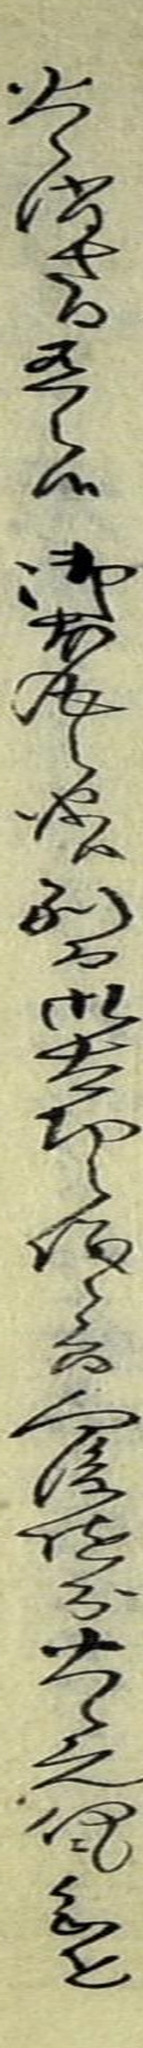火之消さる有之候御本丸之儀ハ別而御太切之儀ニ候間向後随分火之元何も念を
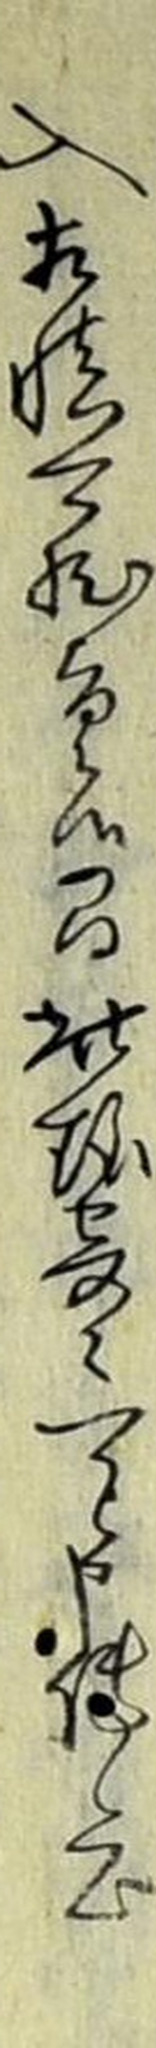入相慎可然旨ニ候間此趣寄々可被申伝候以上
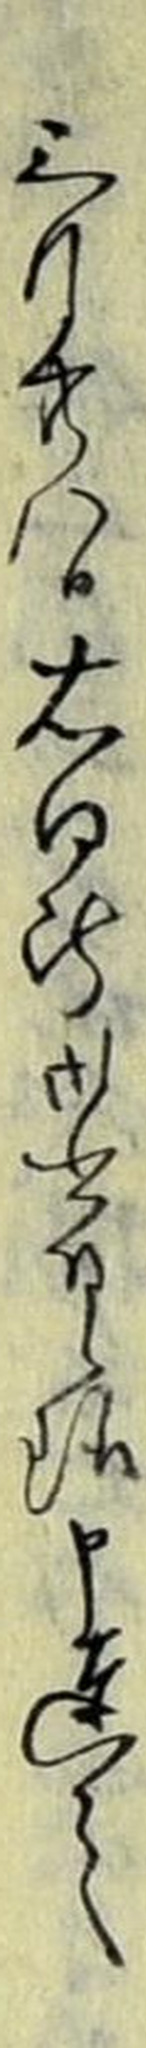三月廿八日右同断御書付之趣申達之

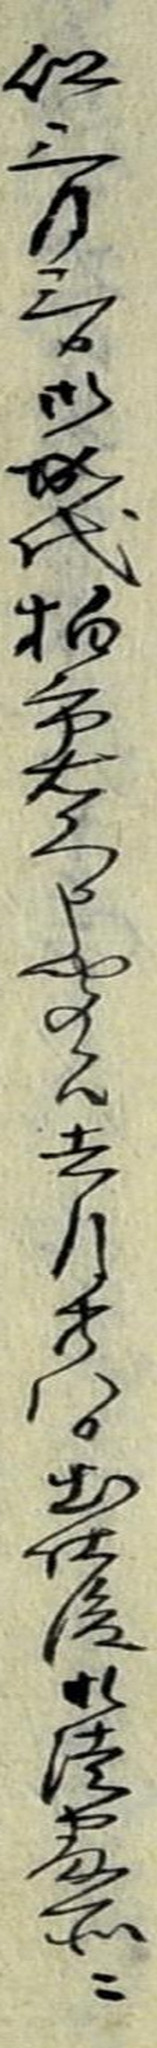但三月三日御城代狛市右衛門申聞候ハ去月廿八日出仕後御徒番所ニ
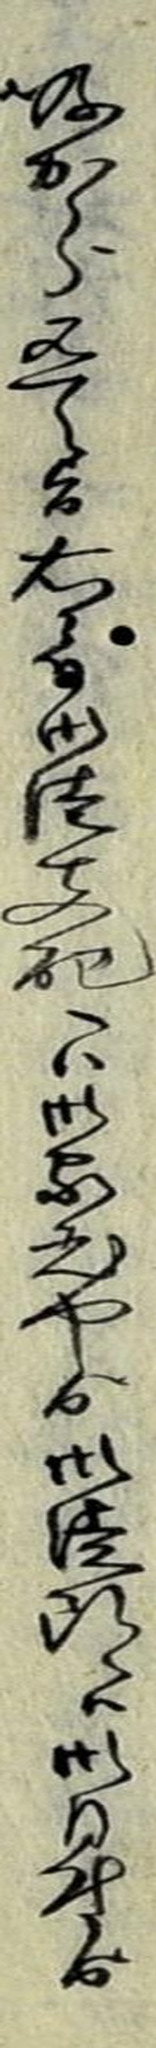吸から有之旨右ニ付御徒支配ヘハ御家老中ゟ御徒頭ヘハ御目付ゟ
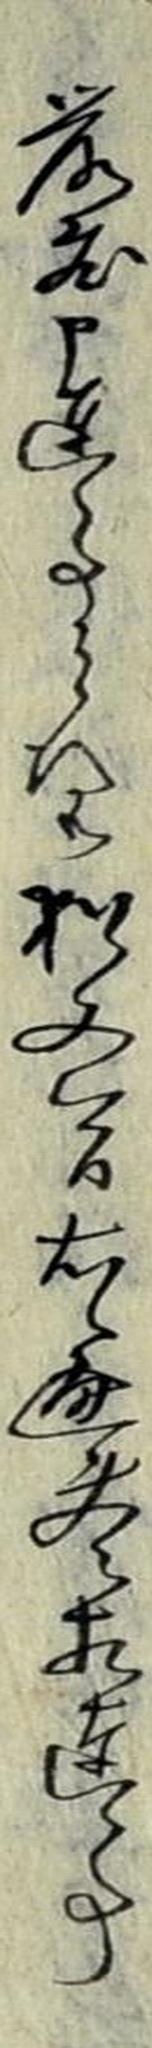厳敷申達候事ニ候得共猶又今日右之通夫々相達候事
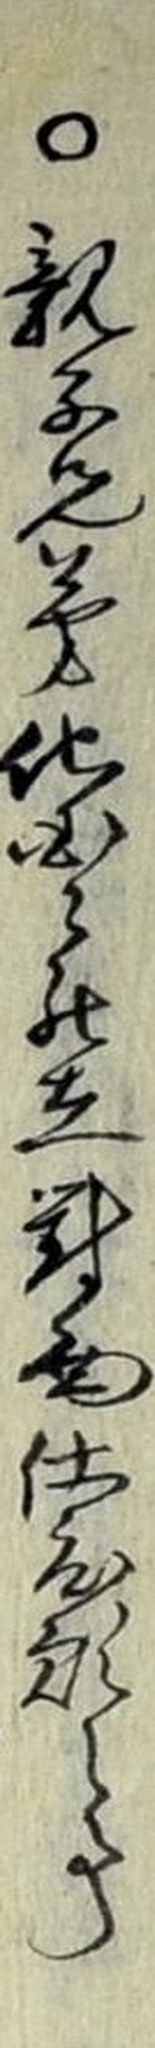〇親子兄弟他国ニ罷在対面仕度願之事
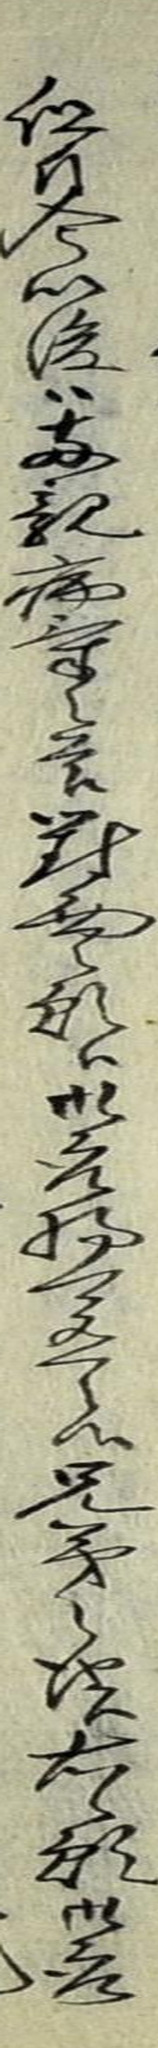但自今以後ハ両親病気之節対面之願ハ御取揚可有之候兄弟之儀ハ右之願御取
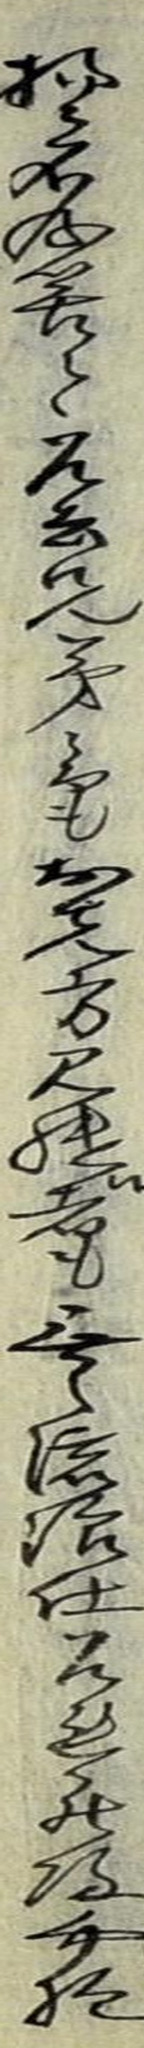揚ニ不及筈ニ候乍去兄弟ニ而も於先方見継候者も無之流浪仕召連罷帰介抱
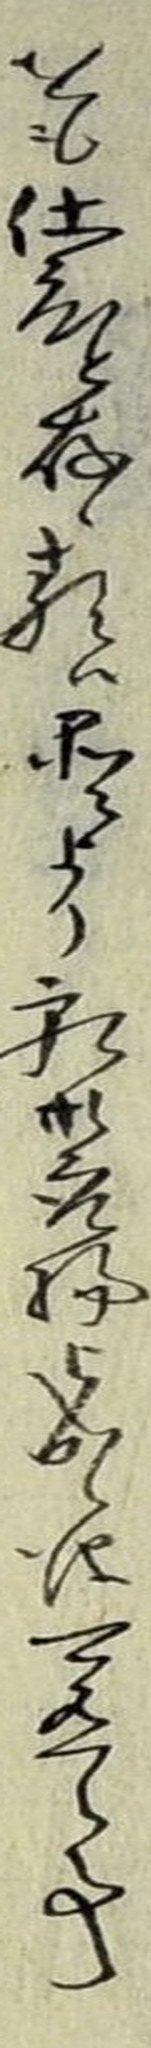をも仕度と存候類ハ品ニより願御取揚被成候儀可有之事
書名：命令之部 一
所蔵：福井県文書館 Fukui Prefectural Archives
